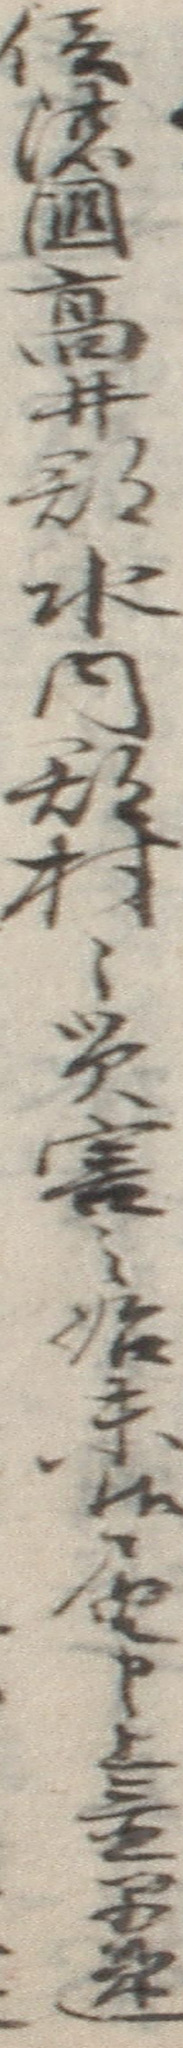信濃国高井郡水内郡村々災害之始末御届申上置早速
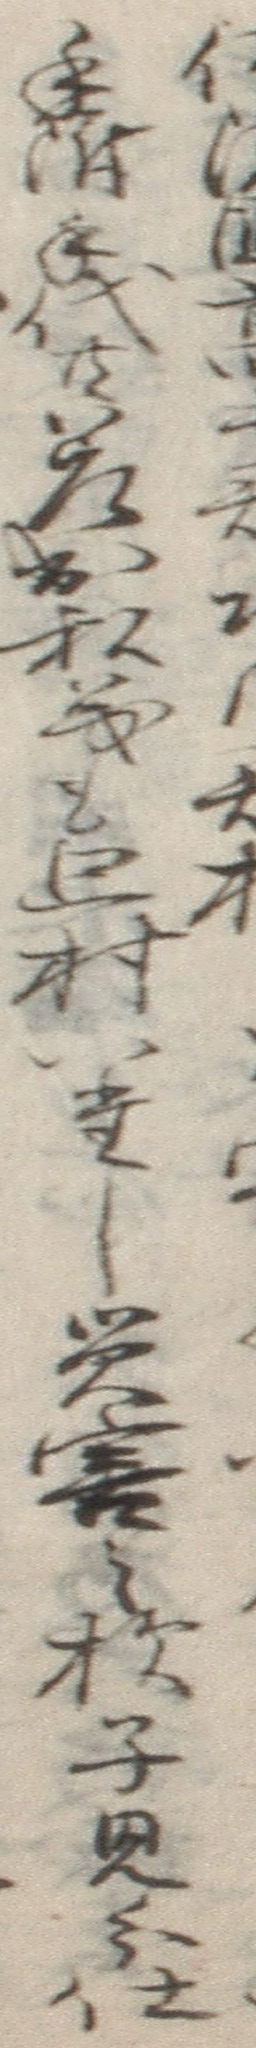手附手代共差出私義も廻村いたし災害之様子見分仕
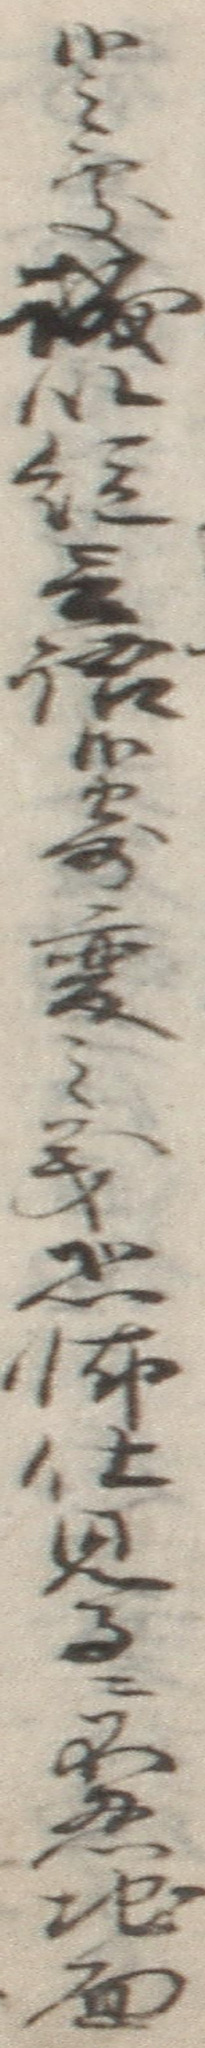候之処誠以絶言語候寄変之義恐怖仕見るニ不忍地面
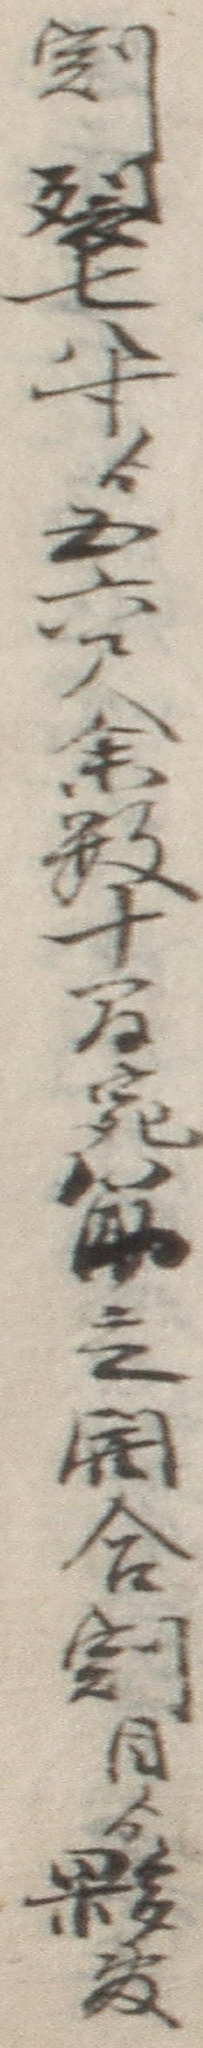割裂七八寸ゟ五六尺余数十間宛筋ニ而開合割目ゟ夥敷

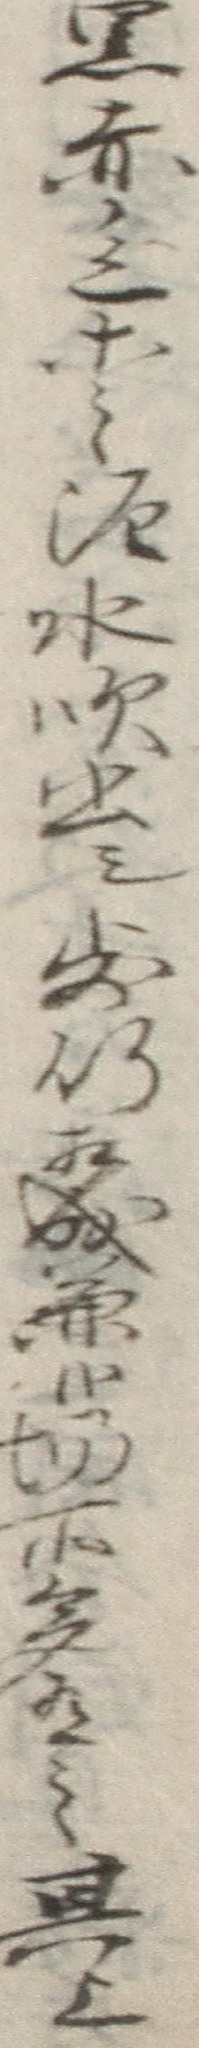黒赤色等之泥水吹出シ歩行相成兼候場所多有之其上
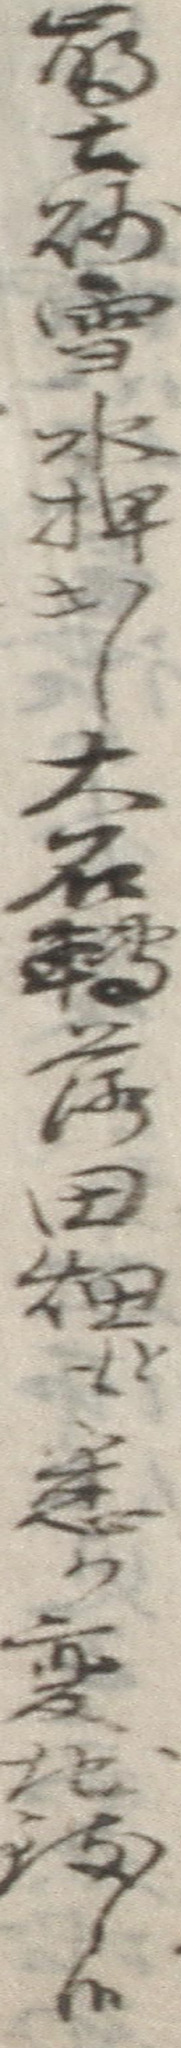崩土砂雪水押出し大石転落田畑とも悉ク変地致し候
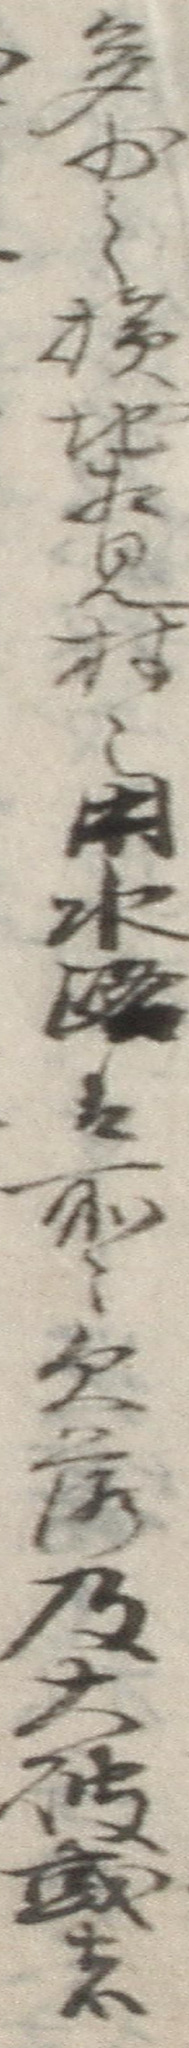多少之損地相見村々用水路は所々欠落及大破或は
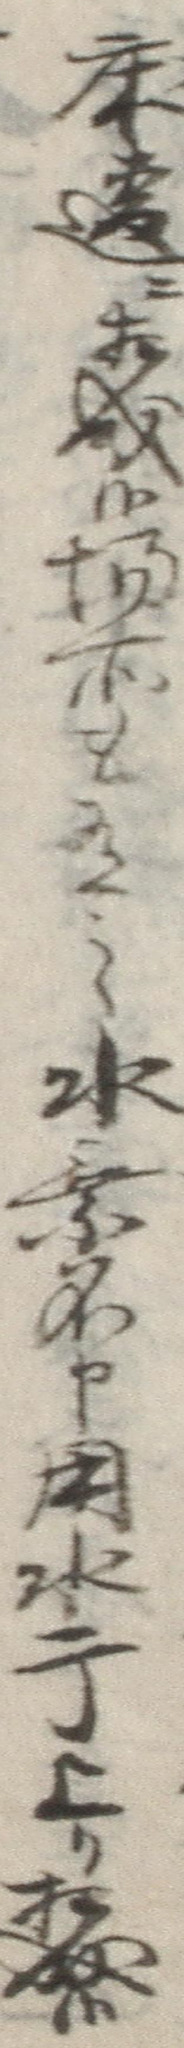床違ニ相成候場所も有之水乗不申用水干上り相成候
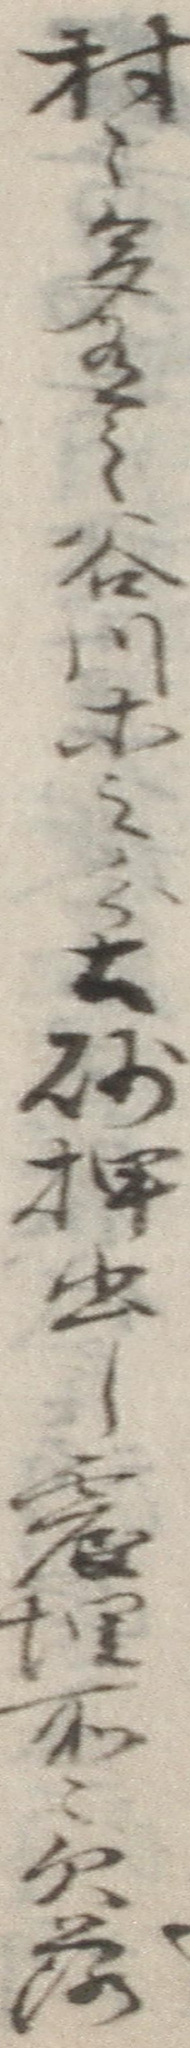村々多有之谷川等之分土砂押出し震埋所々欠落
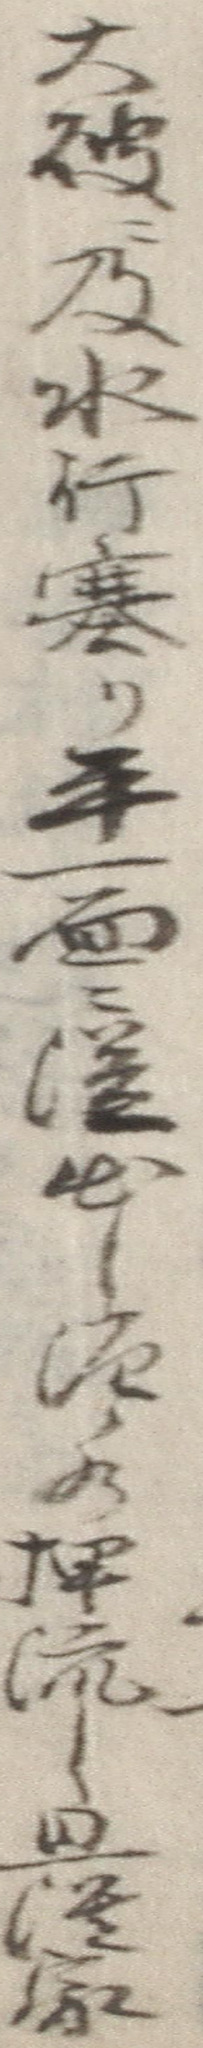大破ニ及水行塞り平一面ニ溢出し泥水押流し且潰家
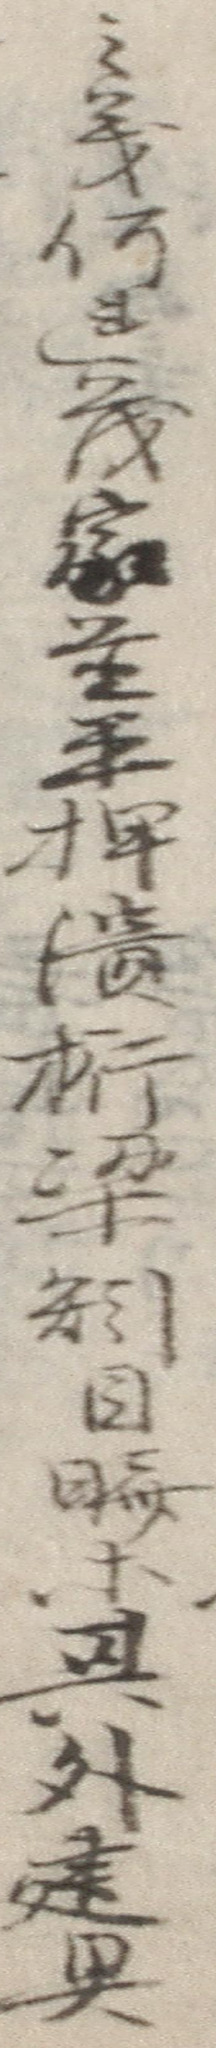之義何れも家置平押潰桁梁矧目臍等其外建具
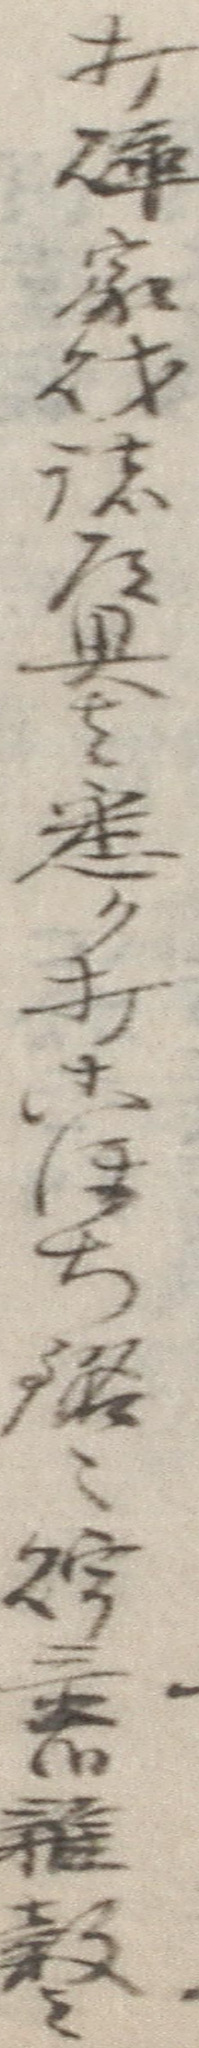打砕家財諸道具は悉ク打こほち銘々貯置候雑穀之
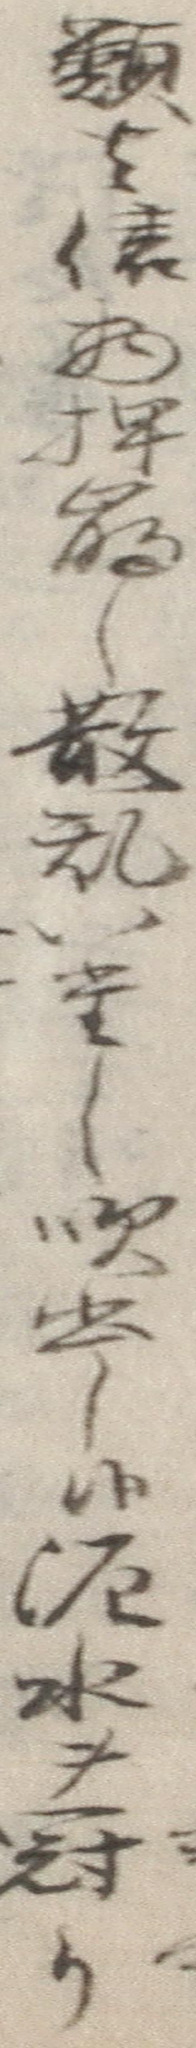類は俵物押崩し散乱いたし吹出し候泥水ヲ冠り
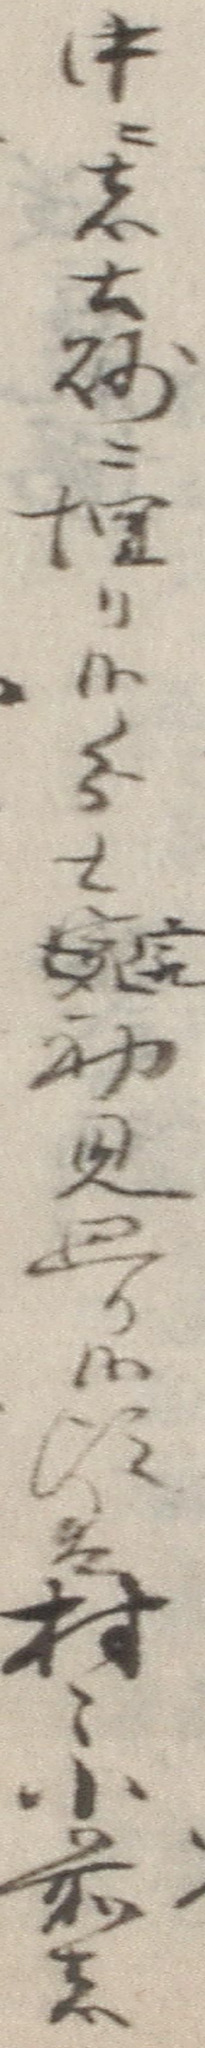中には土砂ニ埋り候歟と最初見廻り候頃は村々小前は
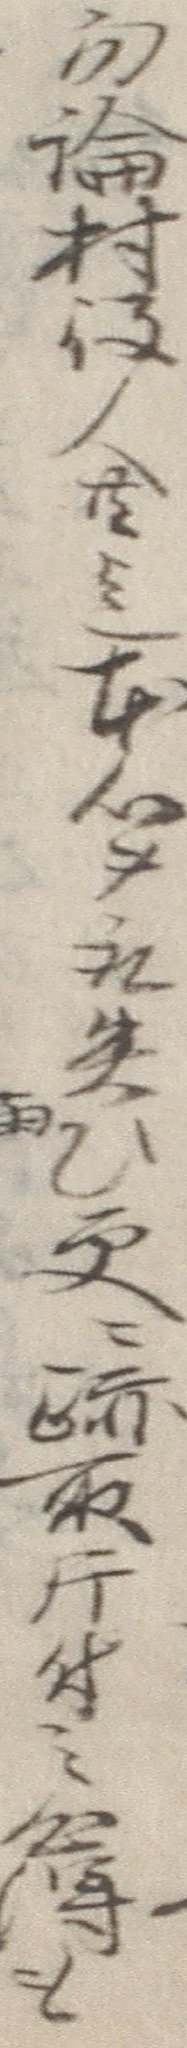勿論役人共迄本心ヲ取失ひ更ニ跡取片付之心得も
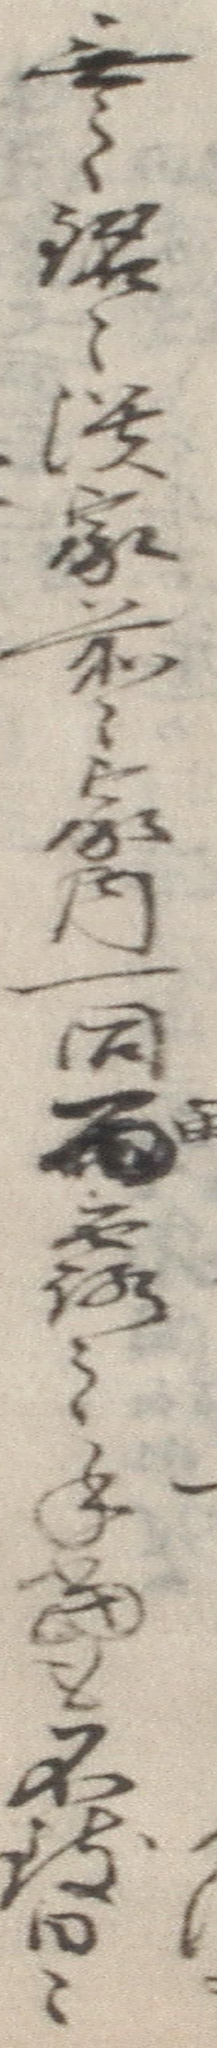無之銘々潰家前々家内一同雨露手当も不致日々
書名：[善光寺地震に関する冊子]
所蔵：東京大学地震研究所図書室 Earthquake Research Institute Library, The University of Tokyo, JAPAN
